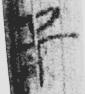子
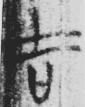吉
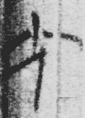小人
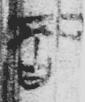否
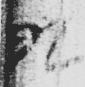九
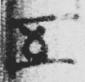五
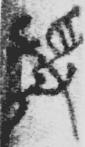嘉
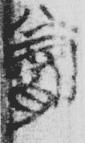○（遯）
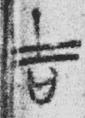吉
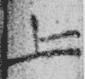上
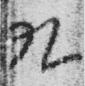九
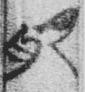肥
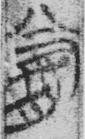○（遯）
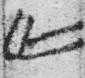亡
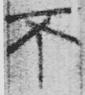不
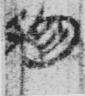利
